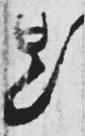也
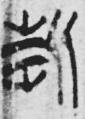折（杕）
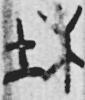杜
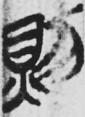則（則）
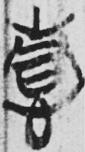情
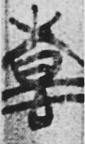憙（喜）
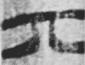亓（其）
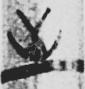至
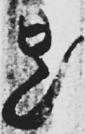也
